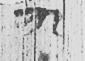九
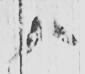八
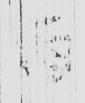百
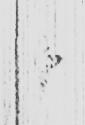十
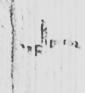七
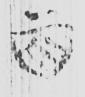百
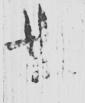廿=
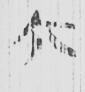六
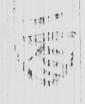百
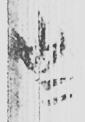卅=
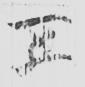五
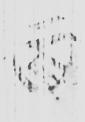百
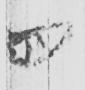四
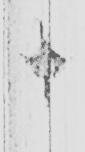十
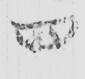四
